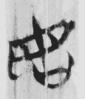{每口}
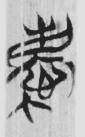慶
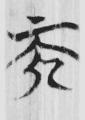而
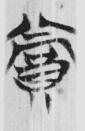賞
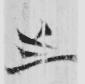之
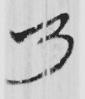乃
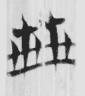冊
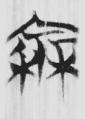秦
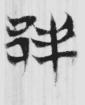邦
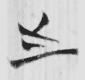之
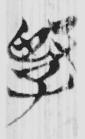孯
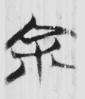余
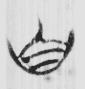自
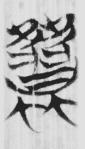蠶
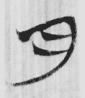月
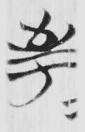{至于}=
